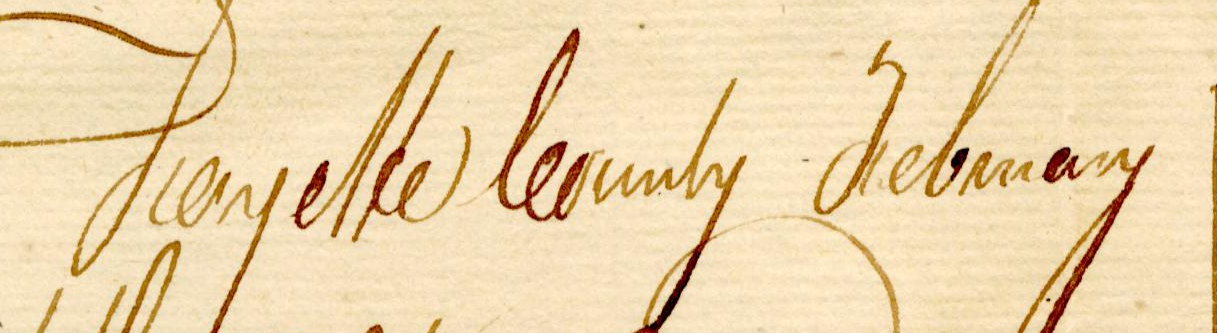Fayette County February
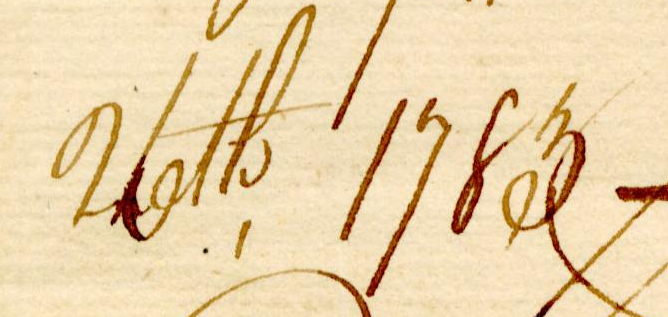26^th. 1783
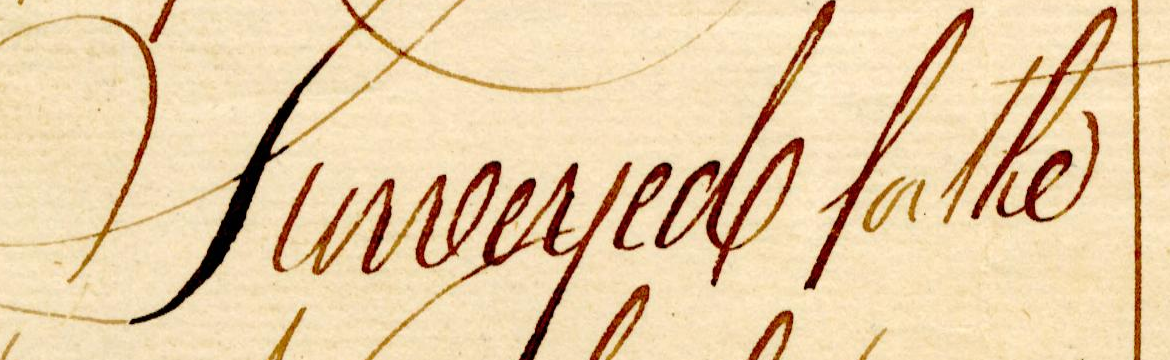Surveyed for the
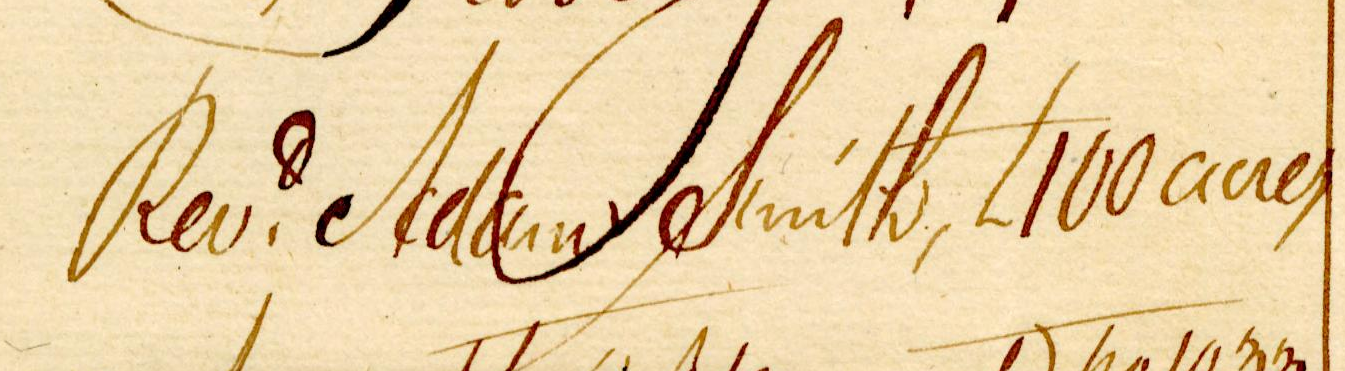Rev^d. Adam Smith, 400 acres
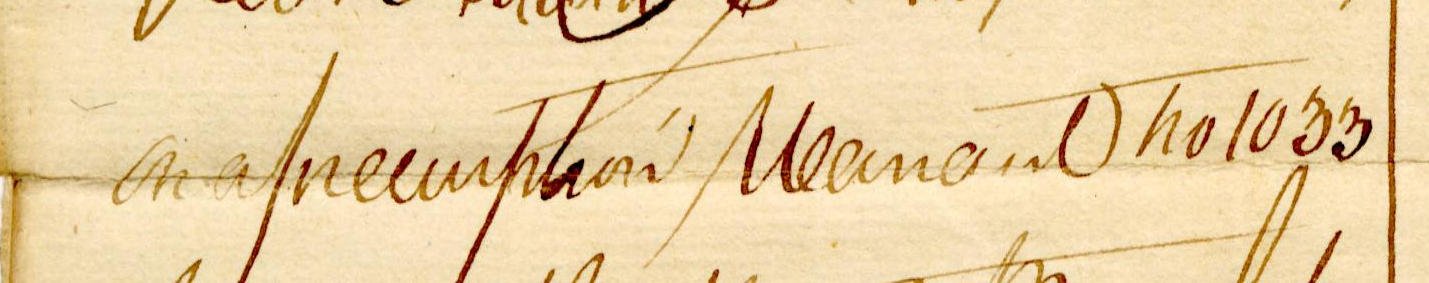on a preception U[_____] h01033
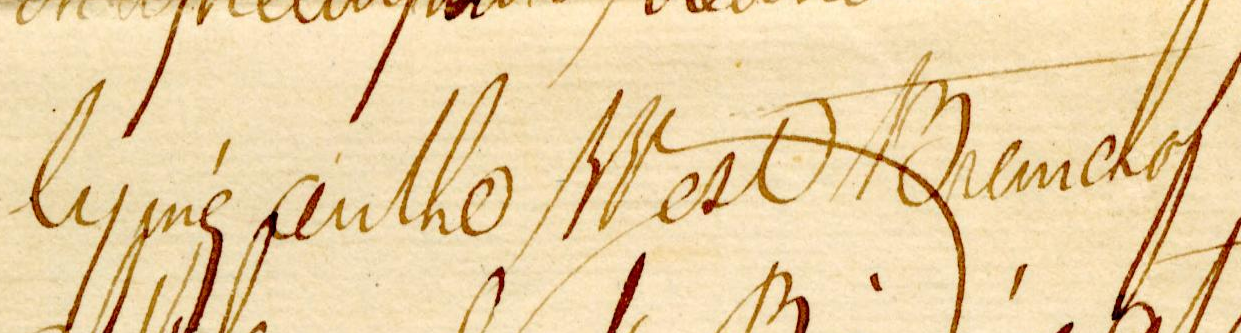lying on the West Bank of
